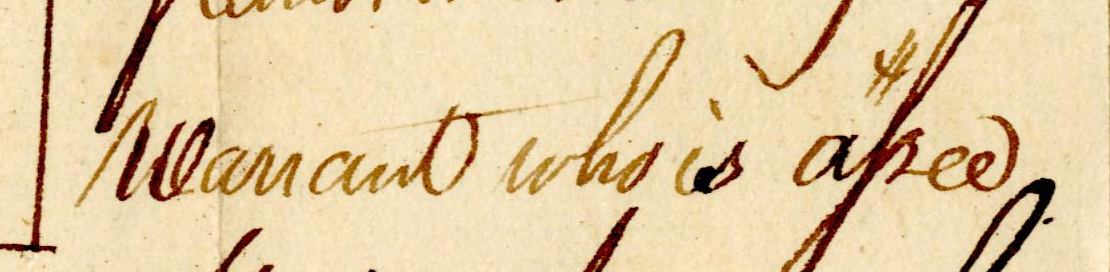Warrant who is assed
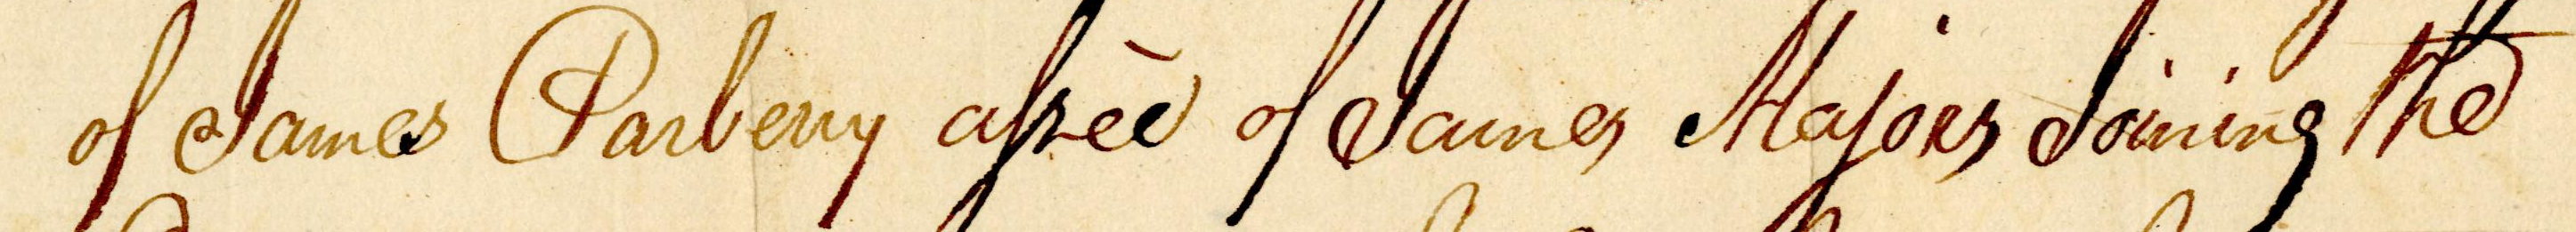of James Parberry afree of James Mayors Joining the
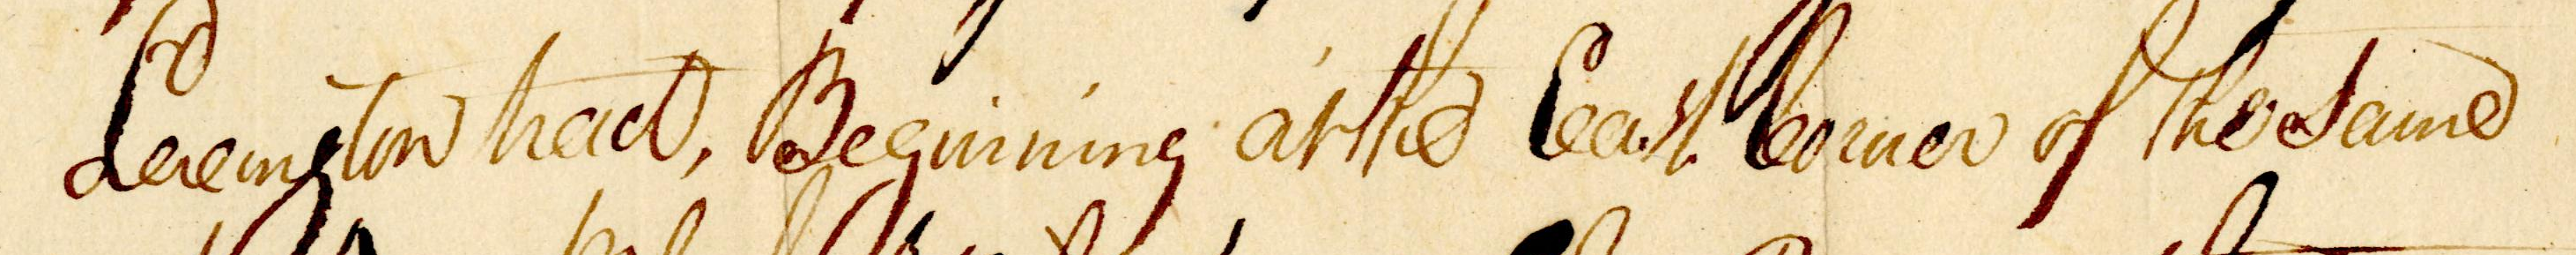Lexington Tract, Beginning at the East Corner of the Said
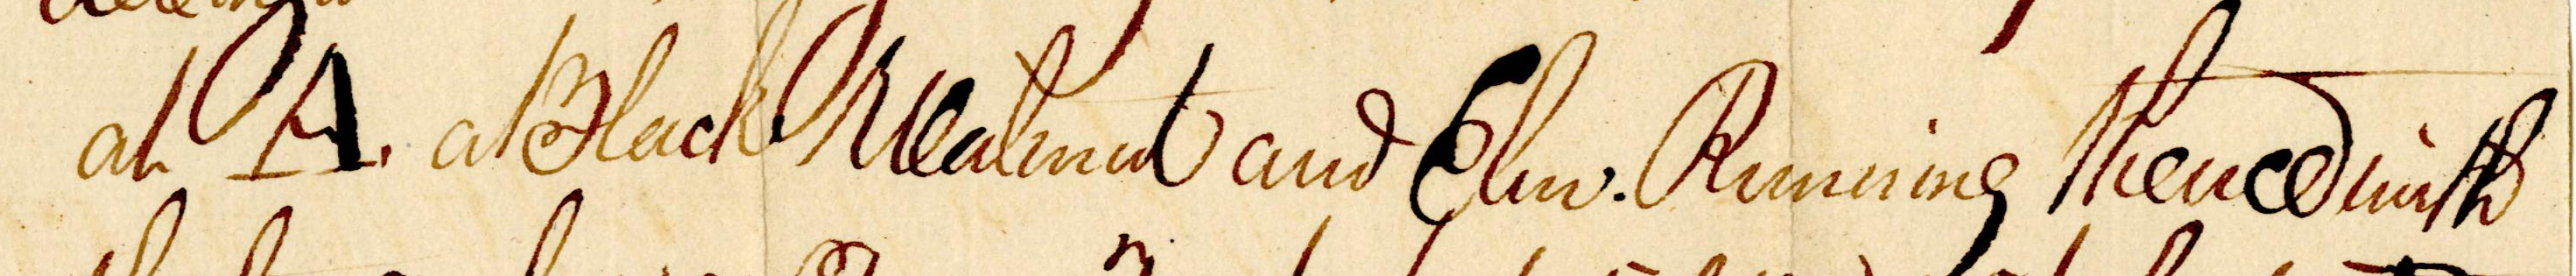at A. a Black Walnut and Elm. Running thence with
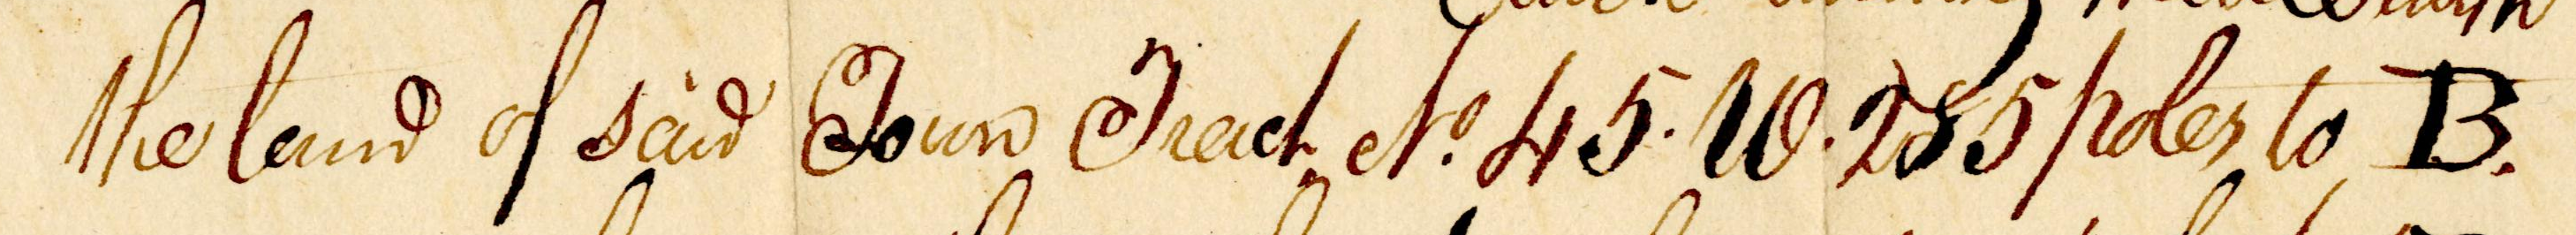the land of Said Town, Tract N^o. 45. W. 285. poles to B.
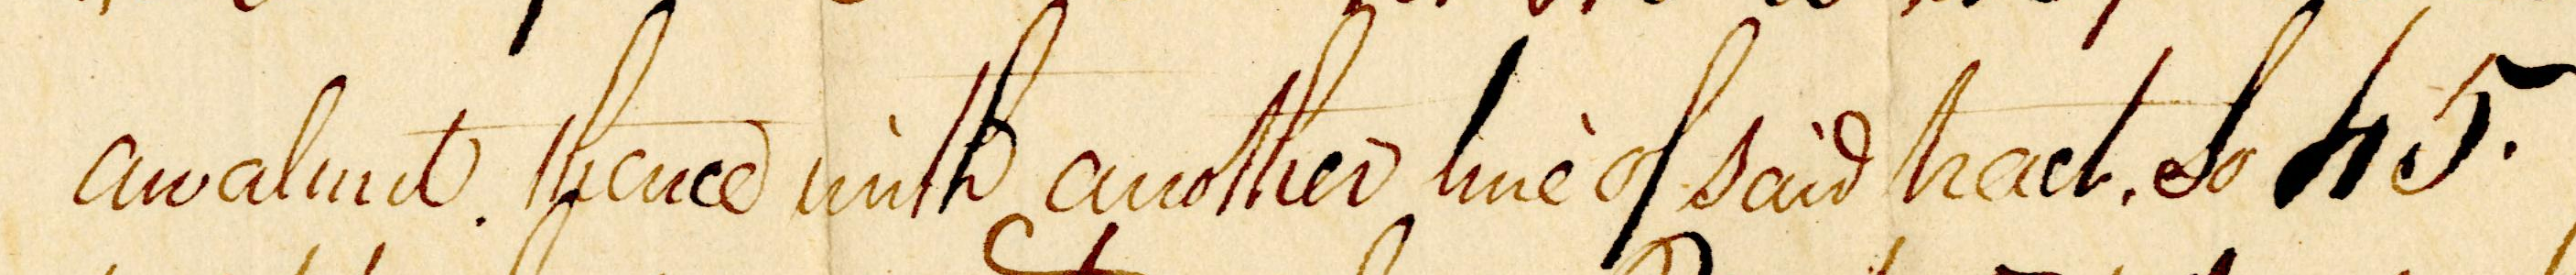A Walnut placed with another time of Said tract, So 45.
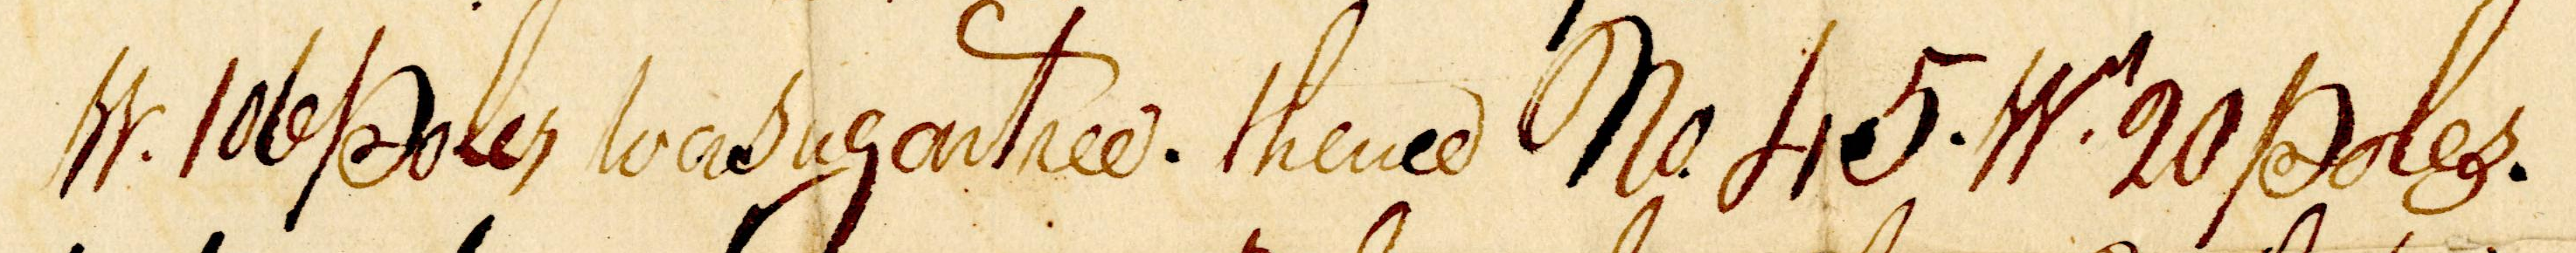W. 106 Poles is a sugartree. thence No. 45 W^t. 20 poles.
